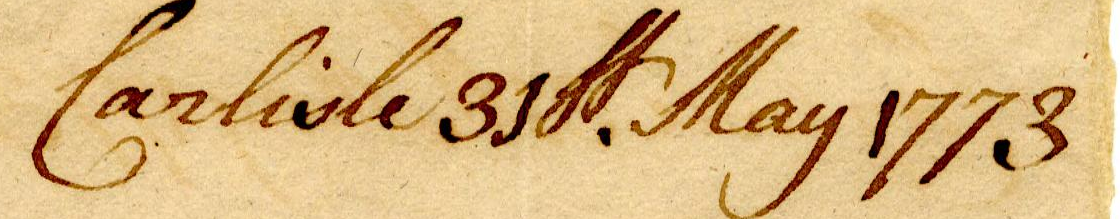Carlisle 31^st. May 1773
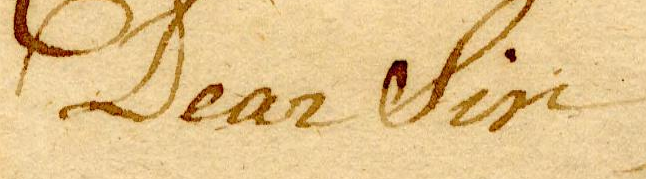Dear Sir,
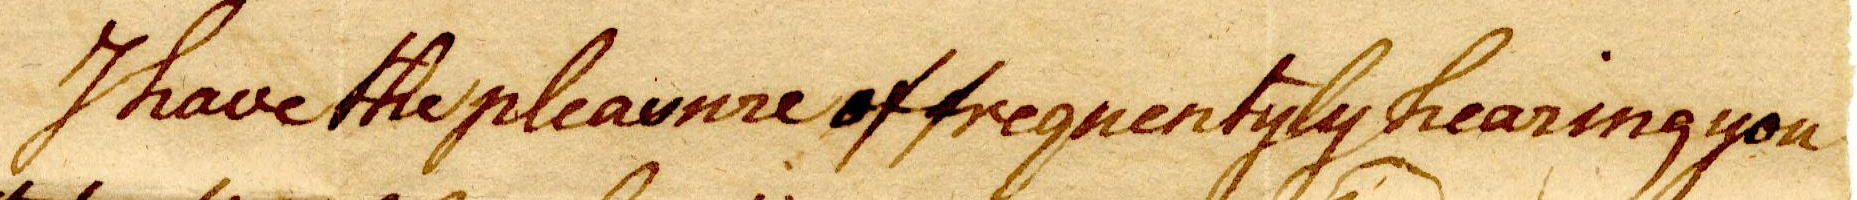I have the pleasure of frequently hearing you
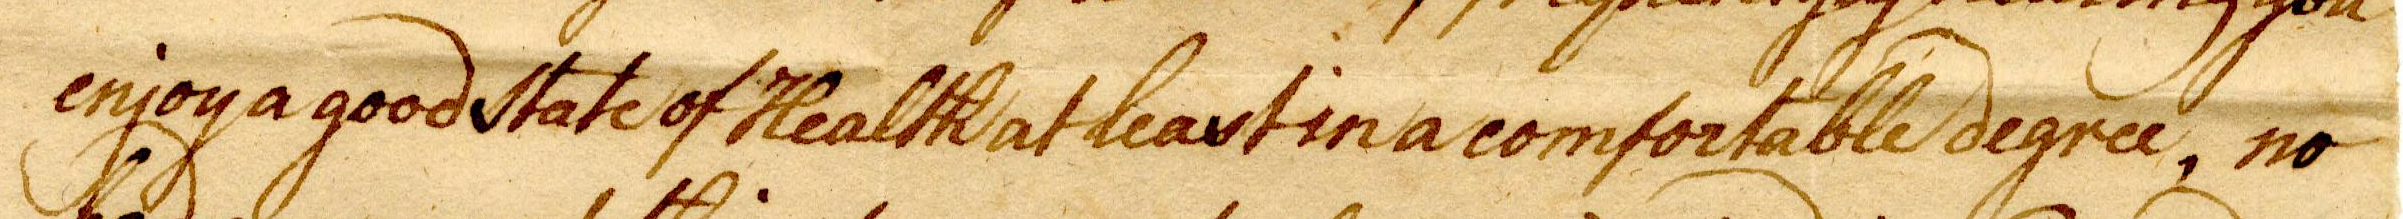enjoy a good state of Health at least in a comfortable degree, no
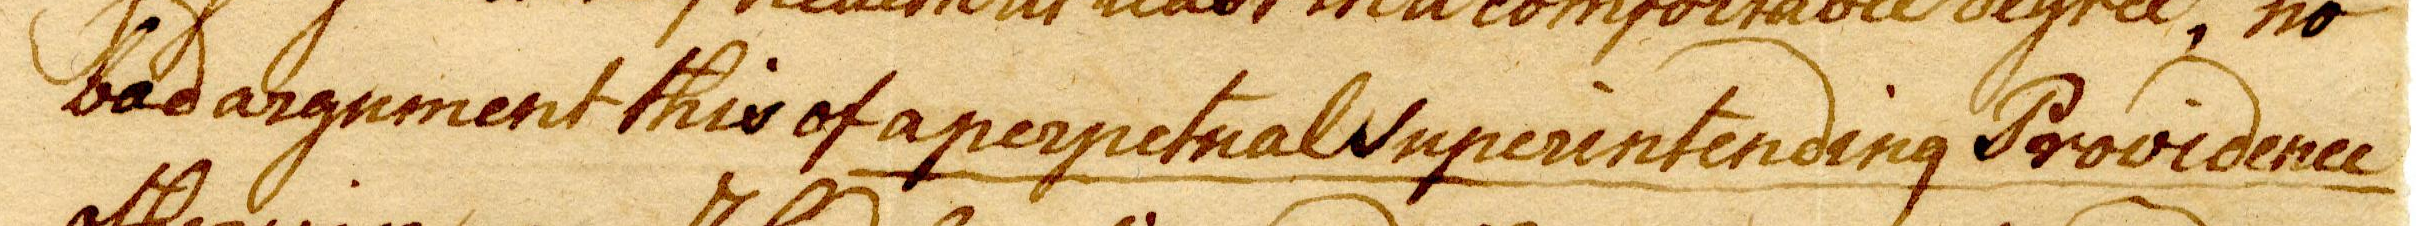bad argument this of a perpetual Superintending Providence
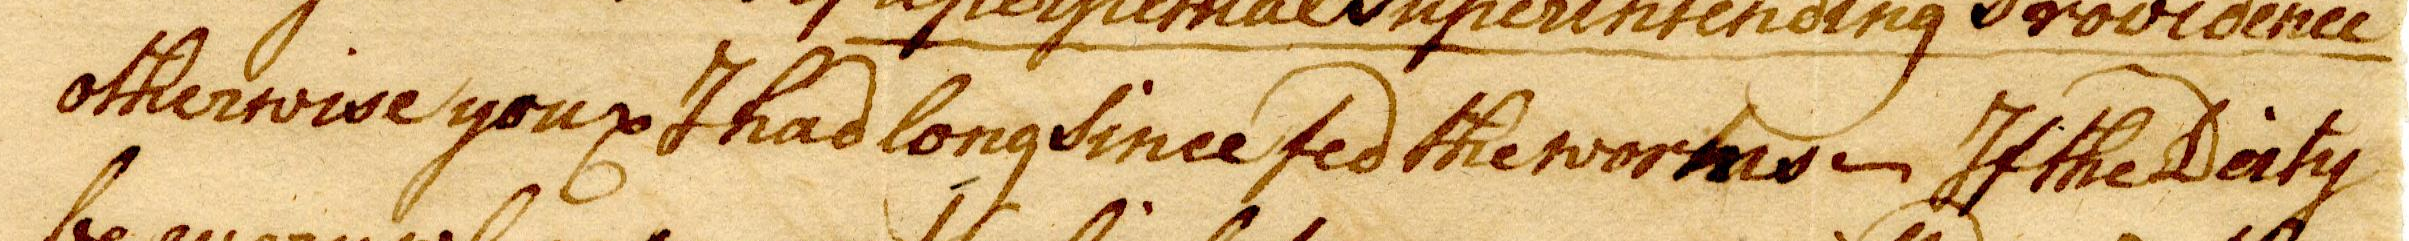otherwise you & I had long Since fed the worms- If the Deity
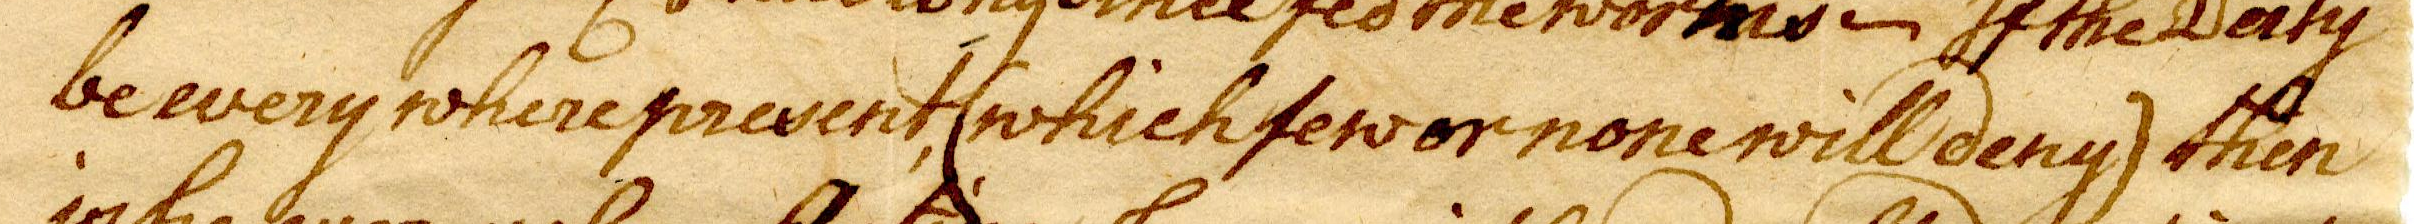be every where present, (which few or none will deny) then
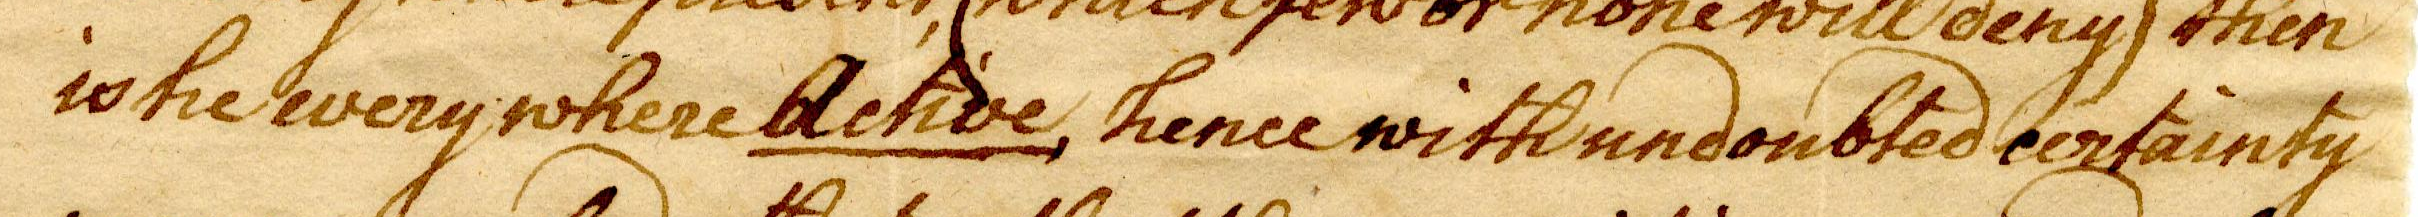is he everywhere Active, hence with undoubted certainty
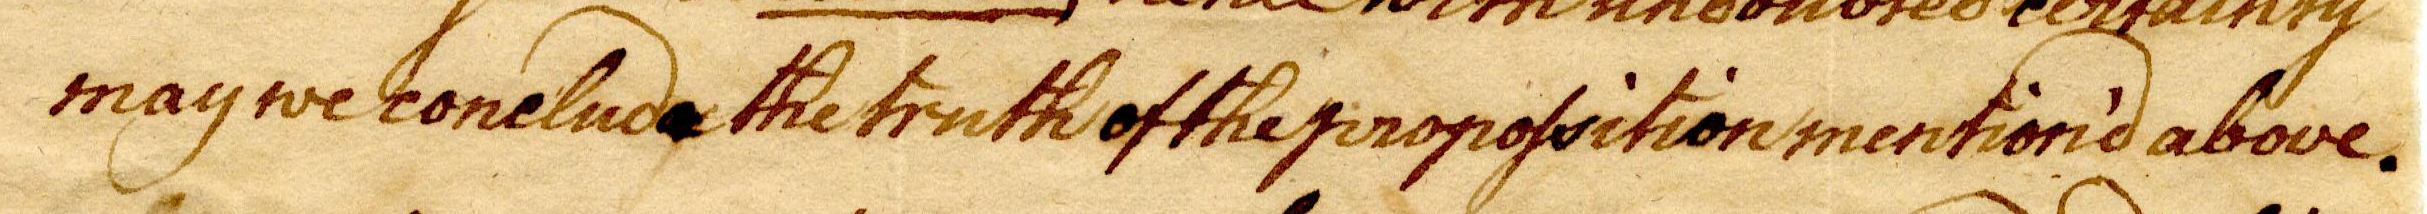may we conclude the truth of the propossition mention'd above.
